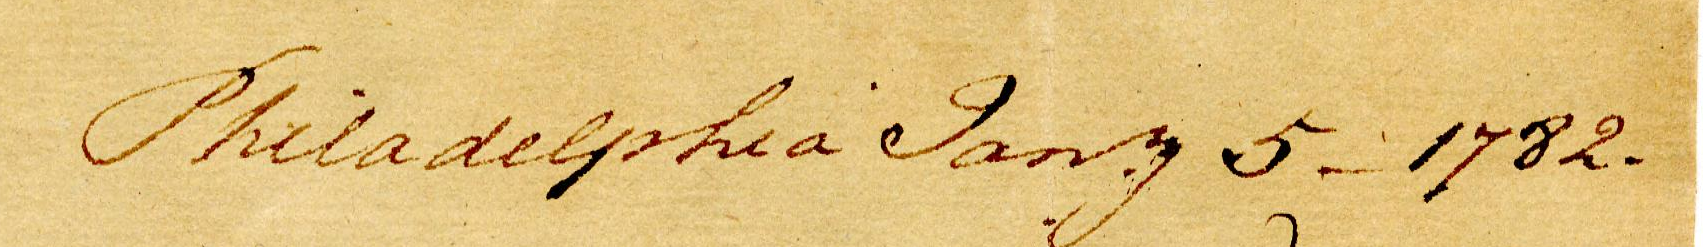Philadelphia Jan.^ry 5- 1782.
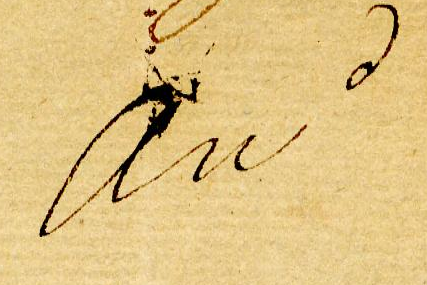An^d
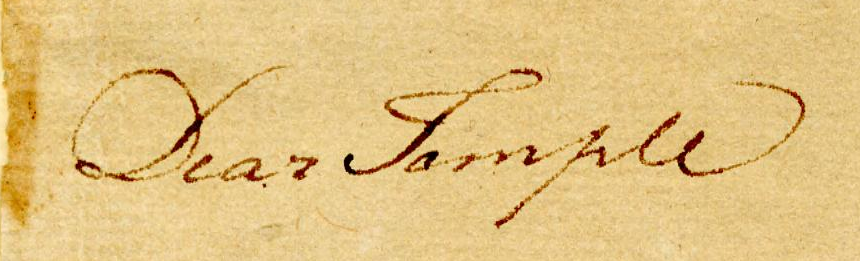Dear Temple
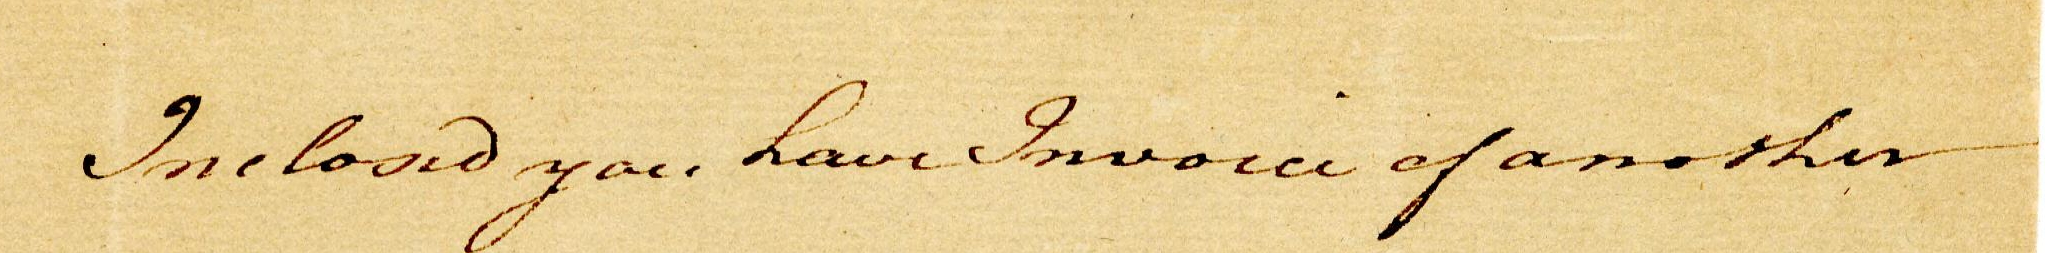Inclosed you have Invoice of another
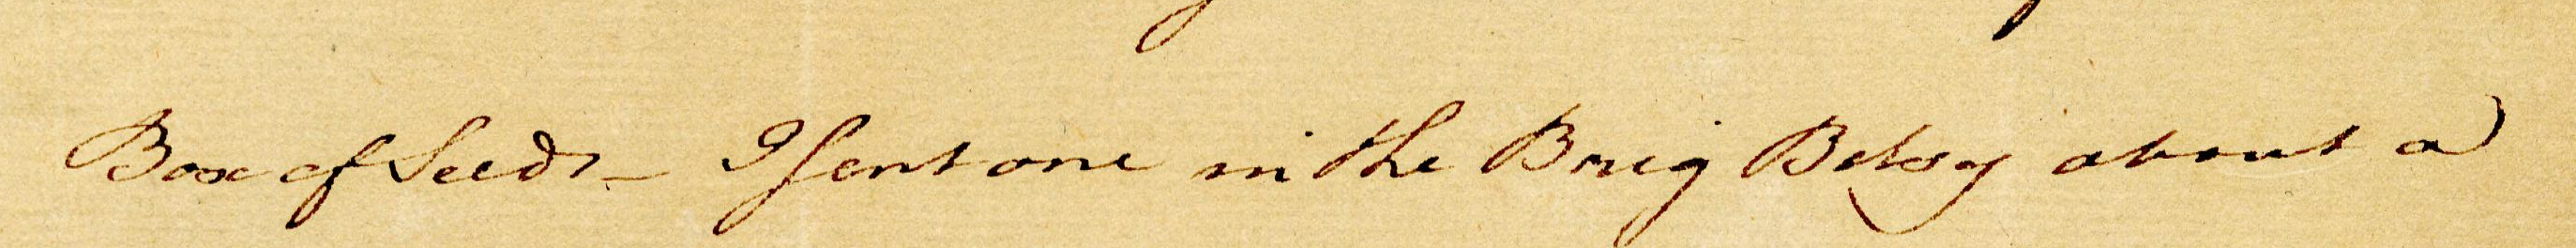Box of Seeds- I sent one in the Brig Betsy about a
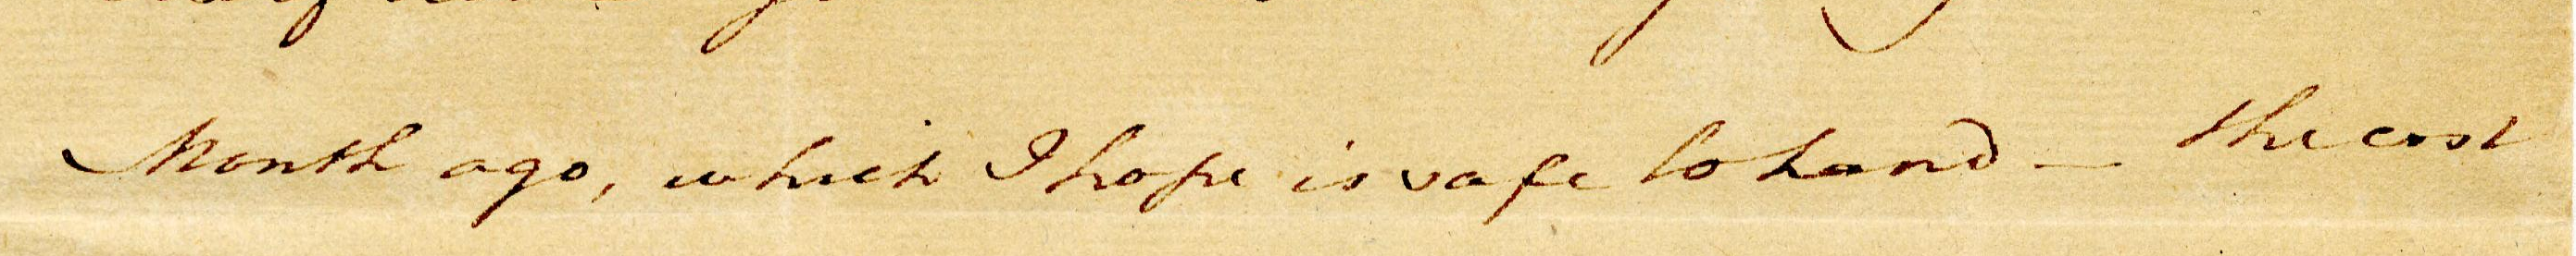Month ago which I hope is safe to hand- the erst
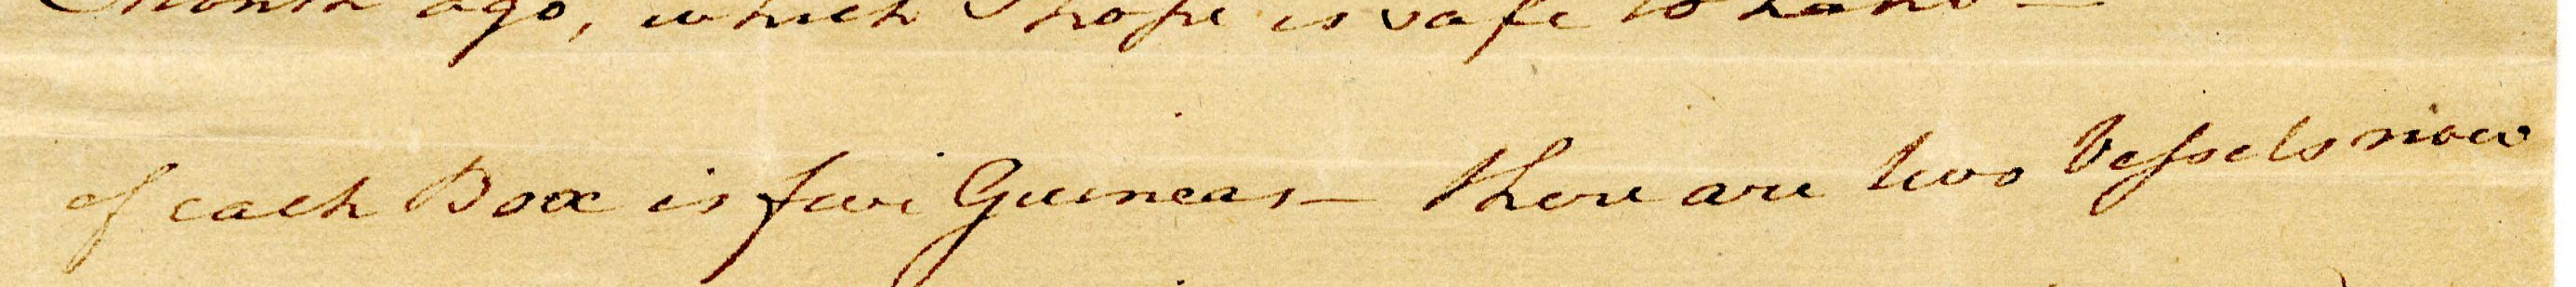of each Box is fivi Guineas- there are two Vessels now
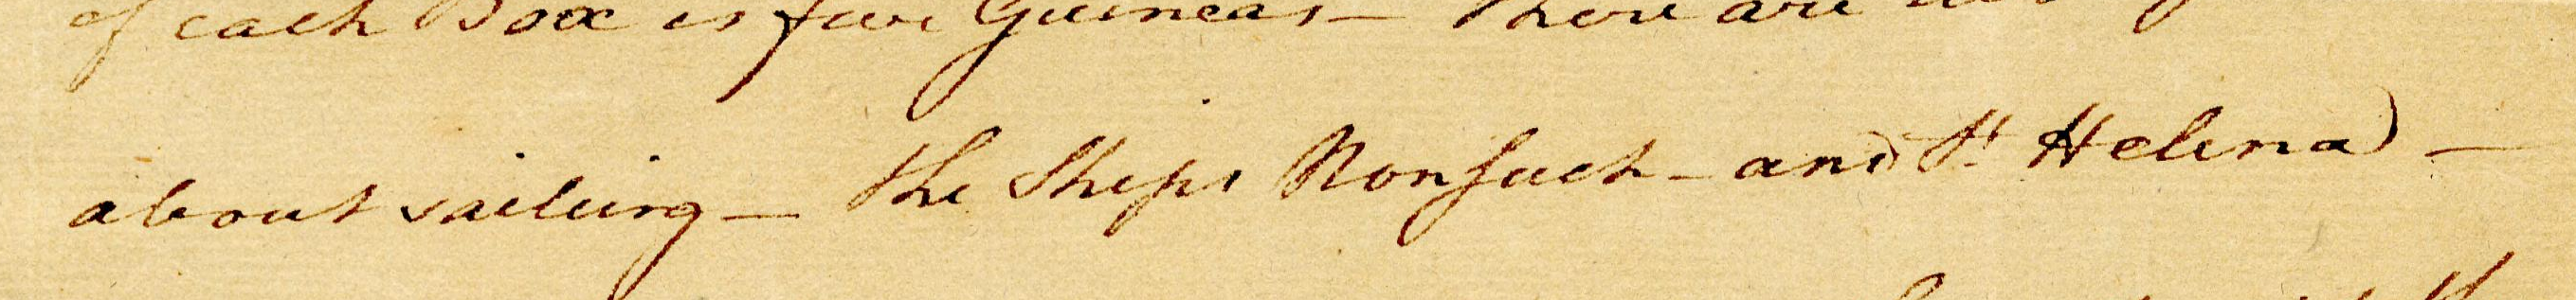about sailing- the Ships Nonsuch- and S^t. Helena-
